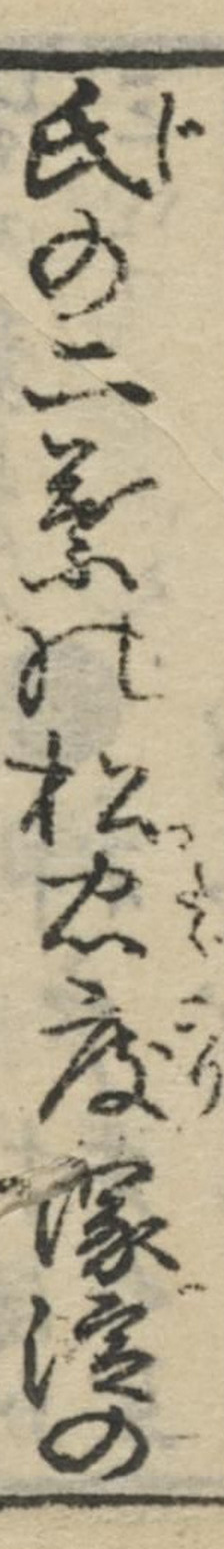氏の二葉の松。忠度塚淀の
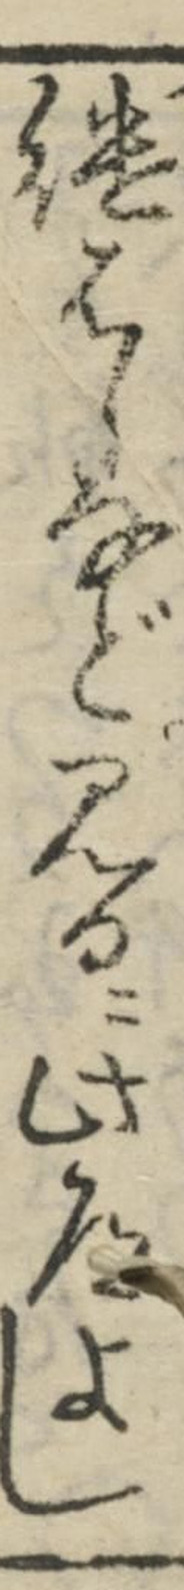継はしなど。見るに此道よし
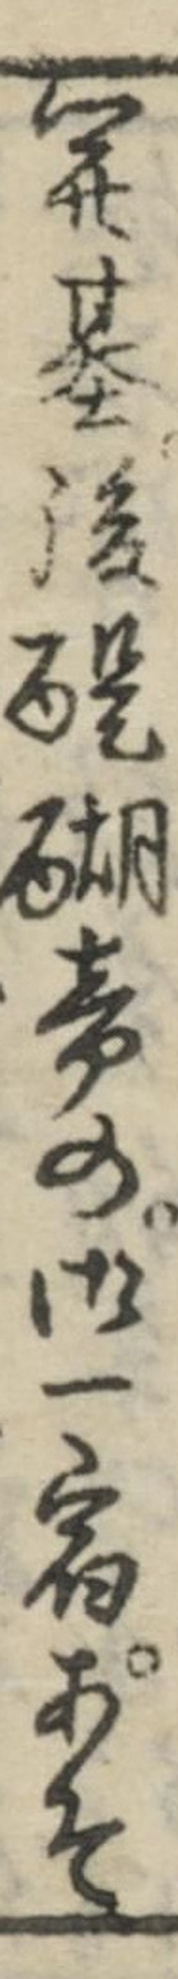開基。後醍醐帝の。御一宿。あそ
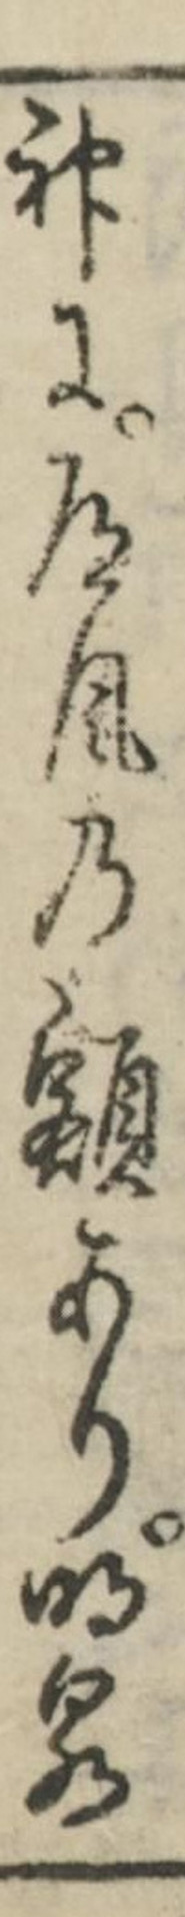神に。道風の額あり。明泉
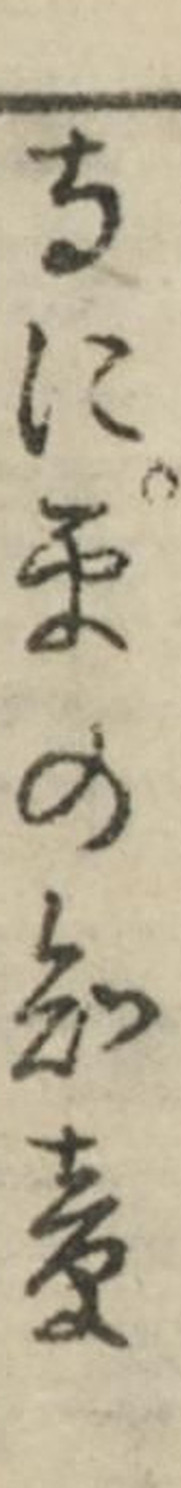寺に。平の知章
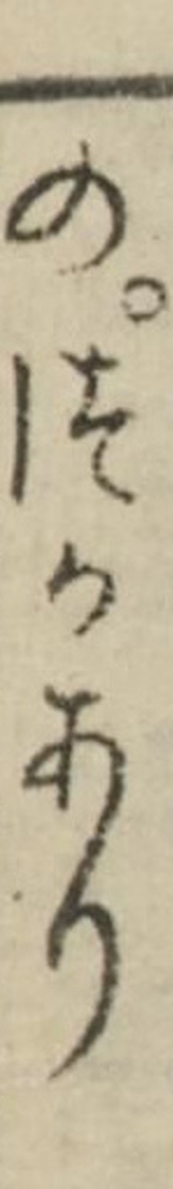の。つかあり

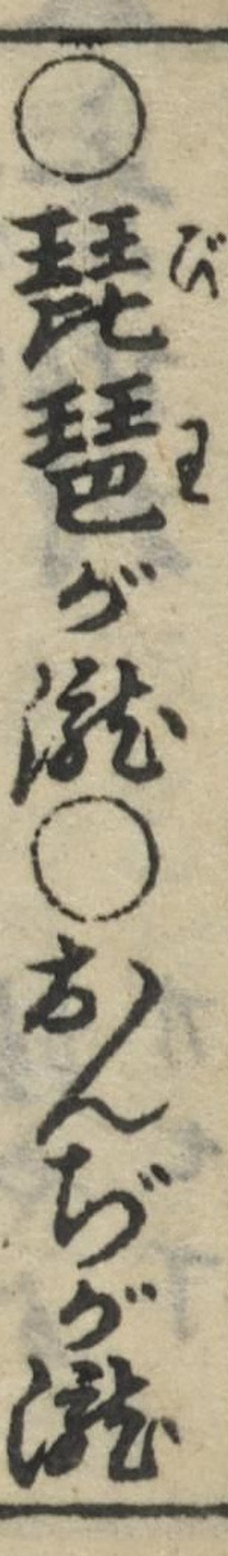○琵琶が瀧○なんぢが瀧
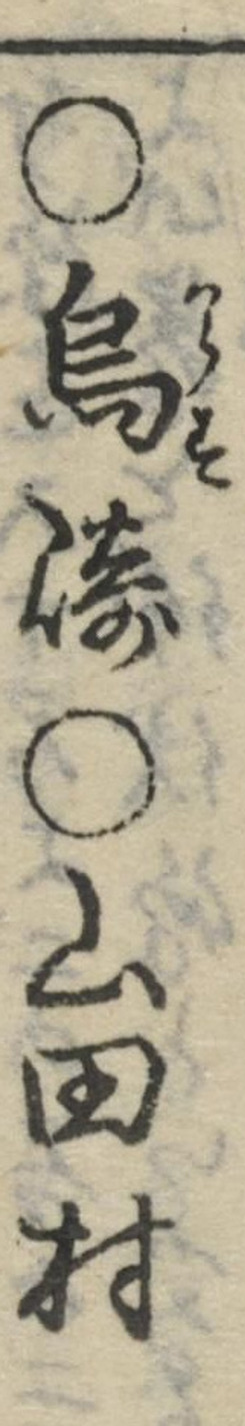○烏崎○山田村
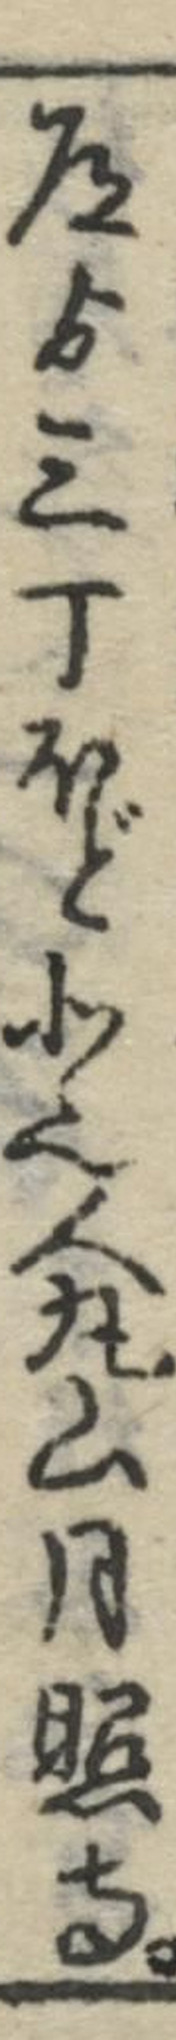道ゟ三丁ほど北也人丸山月照寺。
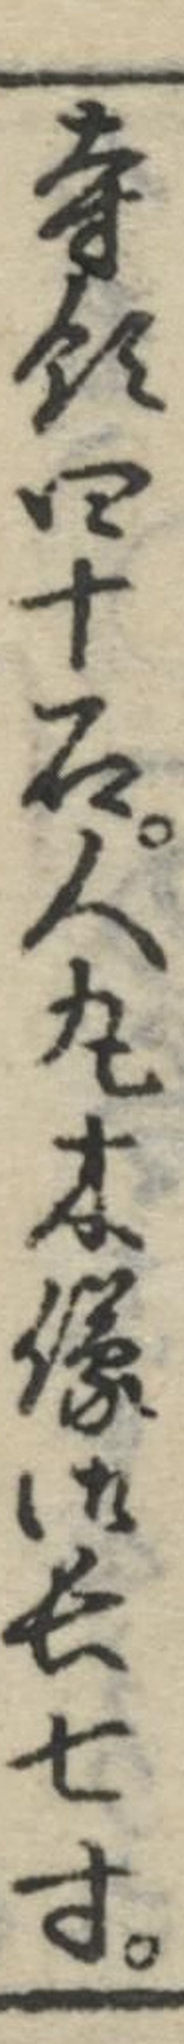寺領四十石。人丸木像御長七寸。
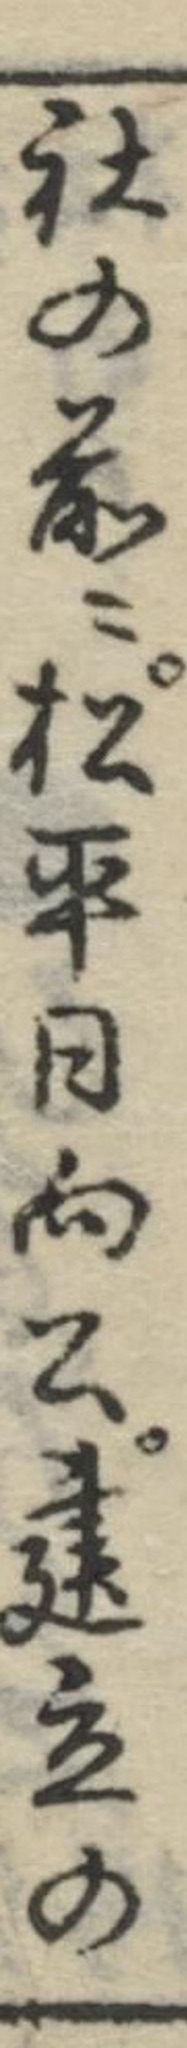社の前に。松平日向公。建立の
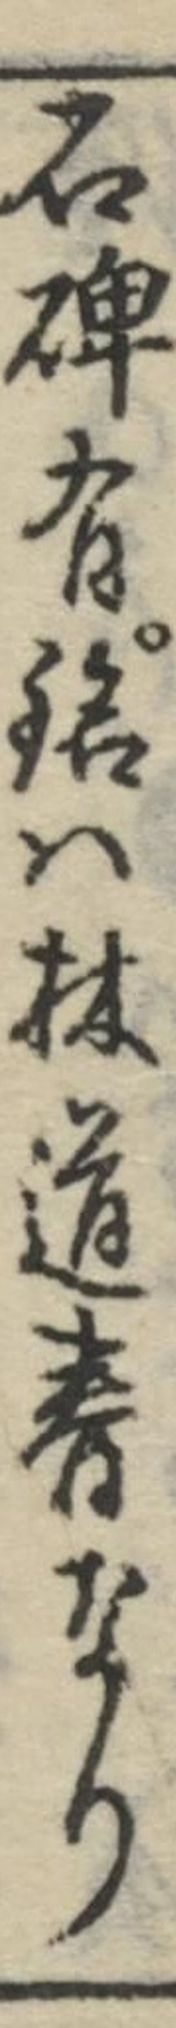石碑有。銘は林道春なり
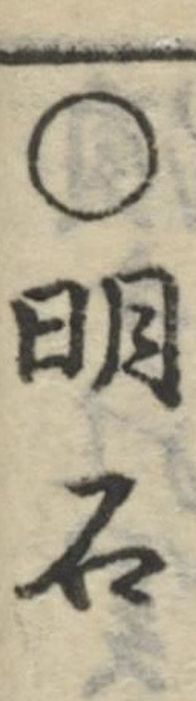○明石
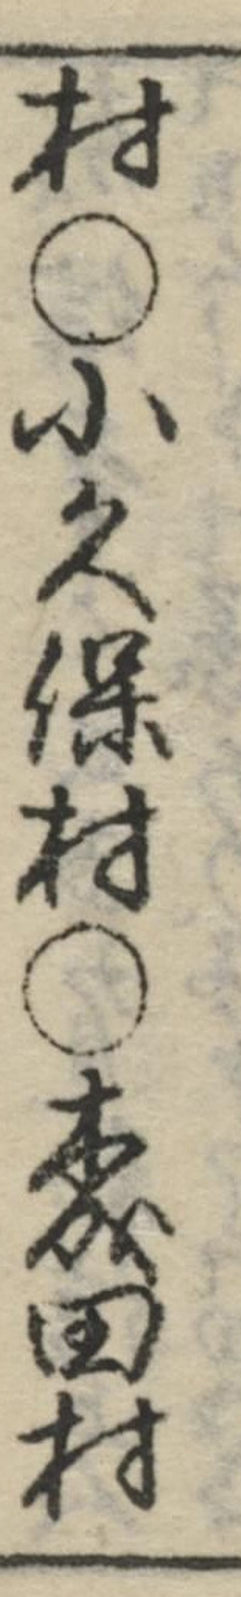村○小久保村○森田村
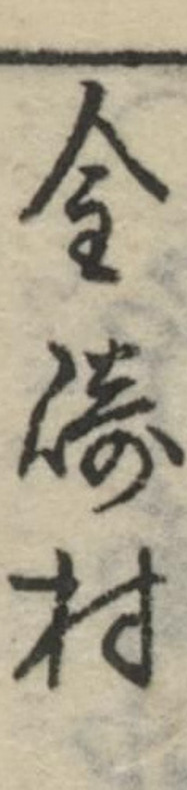金崎村
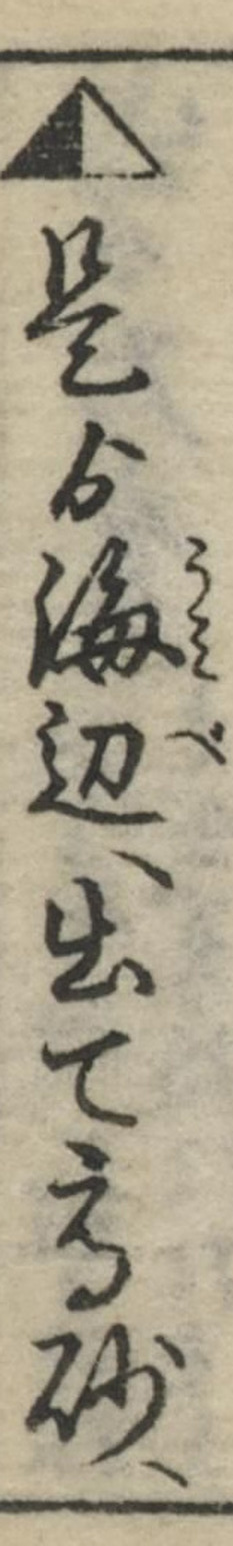▲是ゟ海辺へ出て高砂へ
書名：但州城崎浴湯辧
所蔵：東京大学地震研究所図書室 Earthquake Research Institute Library, The University of Tokyo, JAPAN
